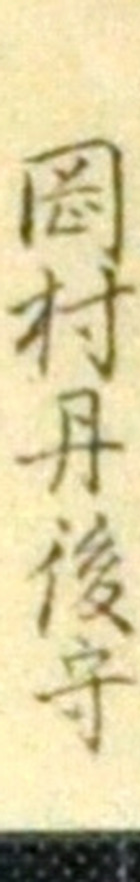岡村丹後守

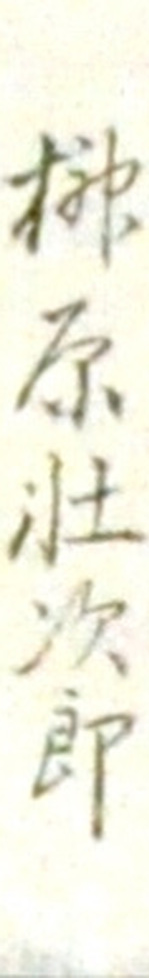榊原壮次郎
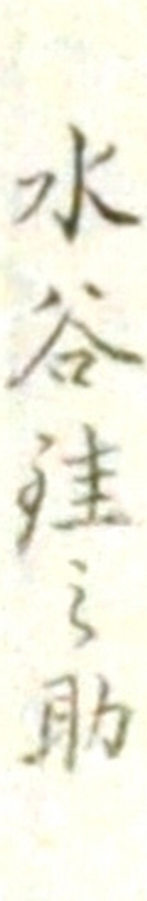水谷銈之助
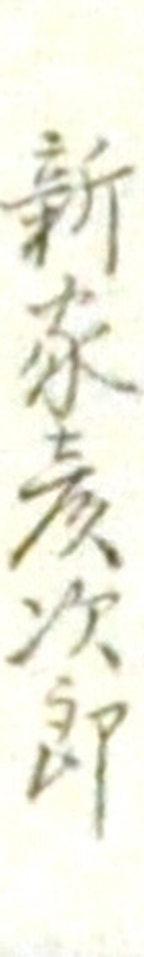新家彦次郎
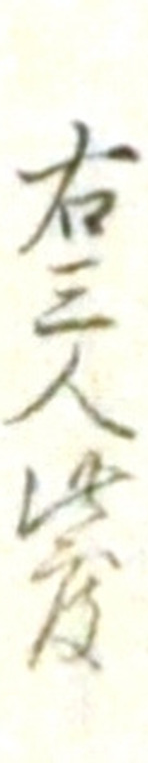右三人此度
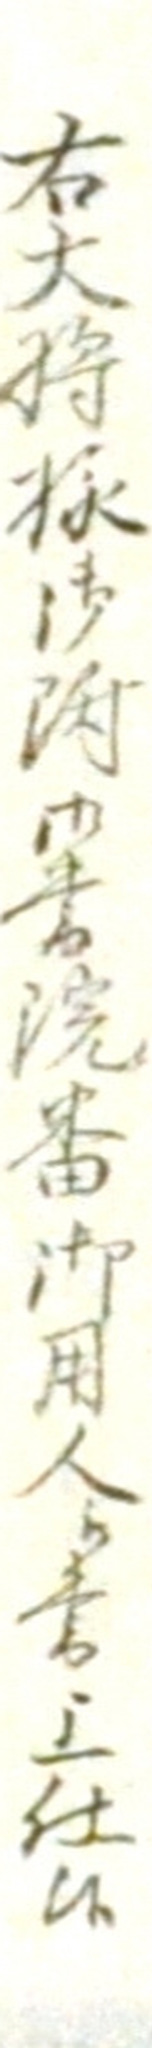右大将様御附御書院番御用人え書上仕候
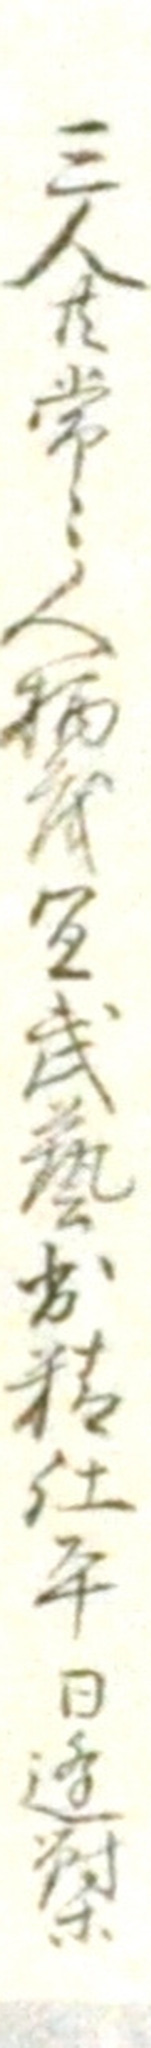三人共常々人柄も宜武芸出精仕平日逢対等
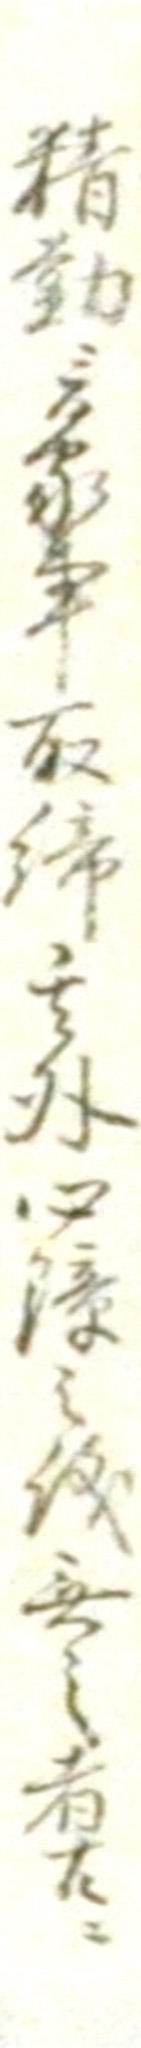精勤にて家事取締其外心障之儀無之者共に
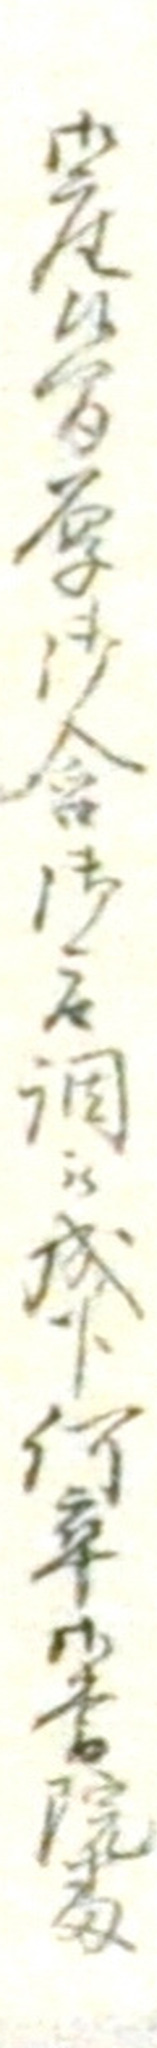御座候間厚御含御取調被成下何卒御書院番
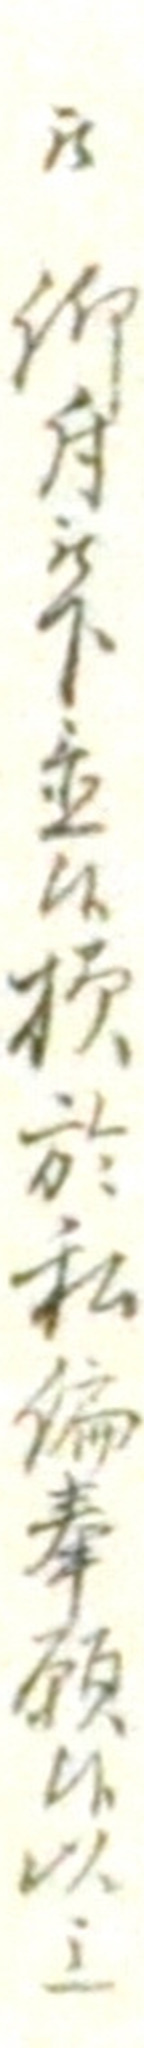被仰付被下置候様於私偏奉願候以上
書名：右大将様御書院番御用人見込書
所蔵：伊那市立高遠町図書館・合同会社AMANE
